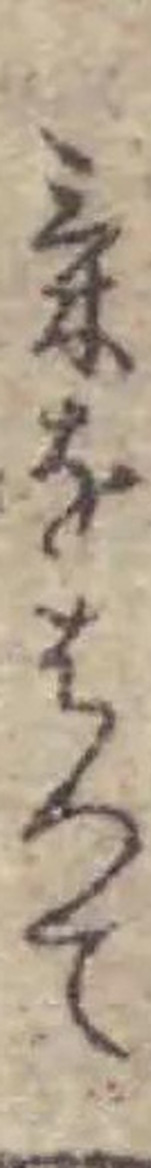気をはつて
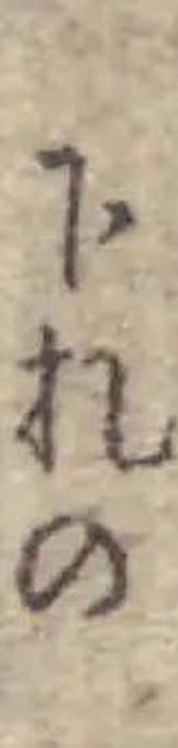下札の
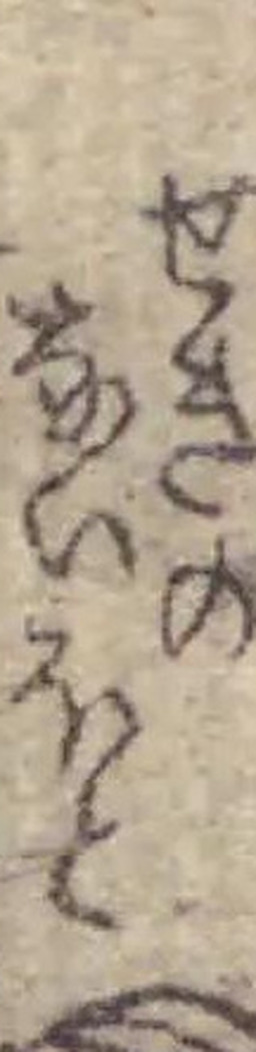ないほと
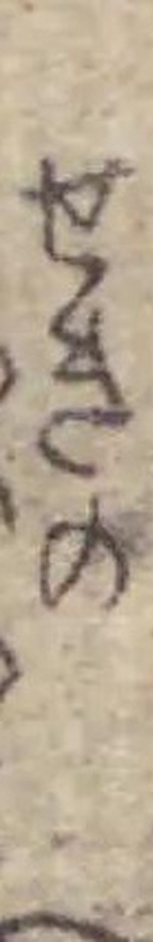せきの
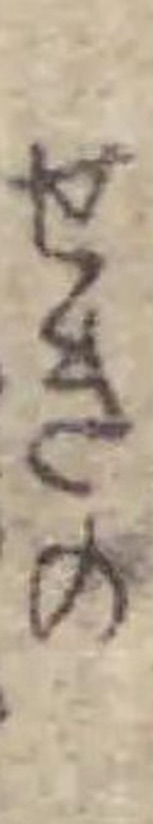せきの
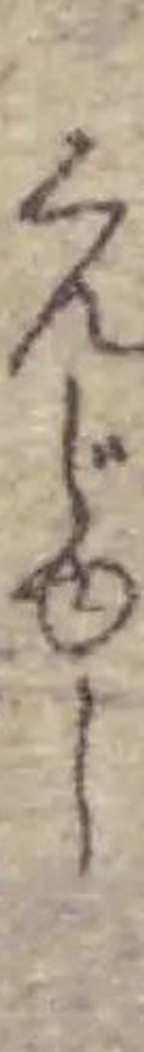くんじゆし

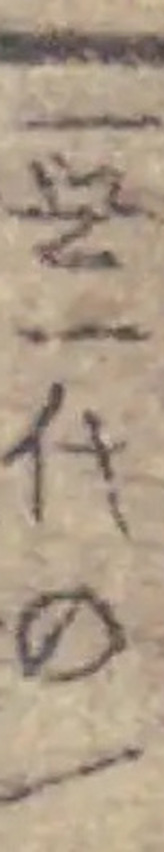一世一代の
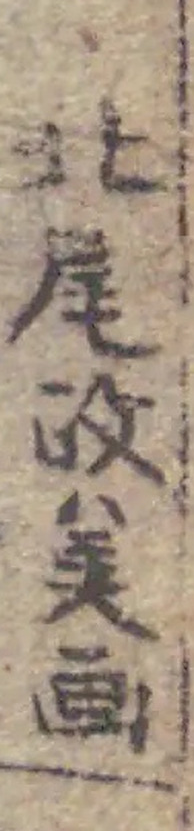北尾政美画
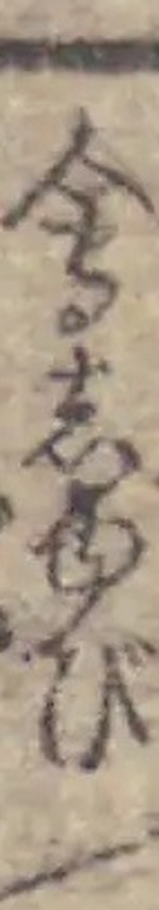会しゆび
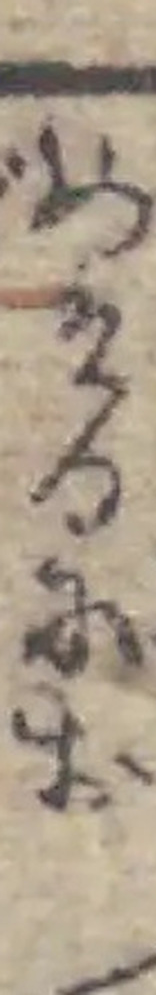めけるにお
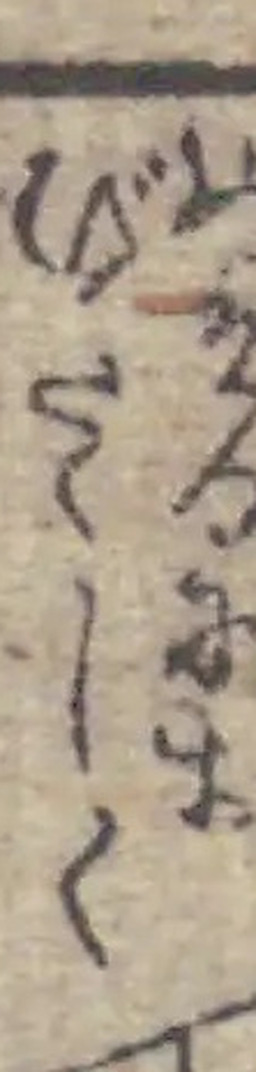びたゝしく
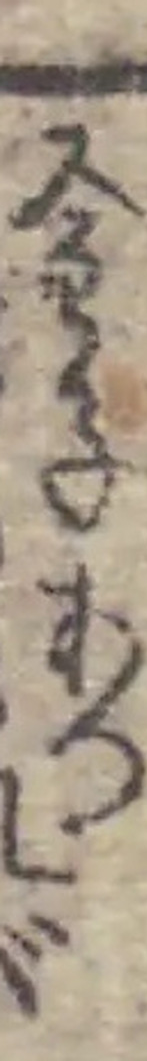金子あつ
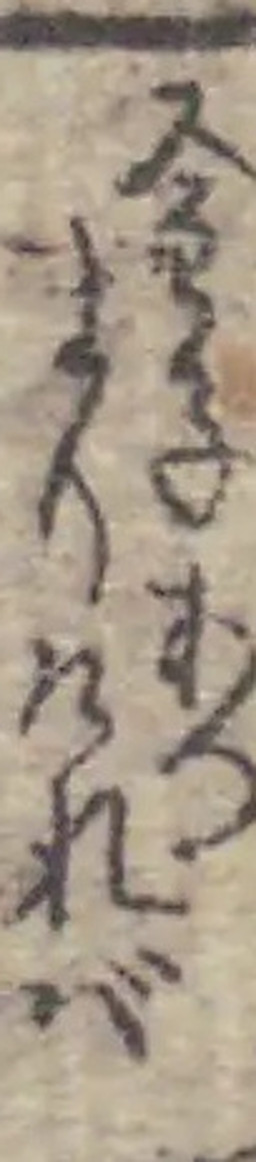まりければ
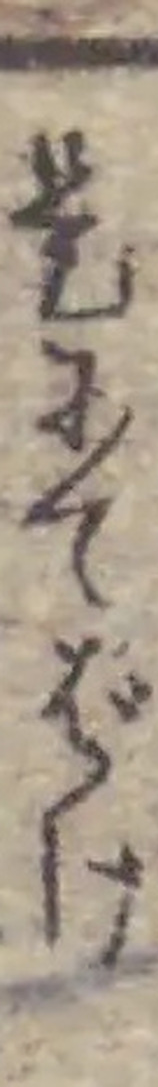是にてばけ
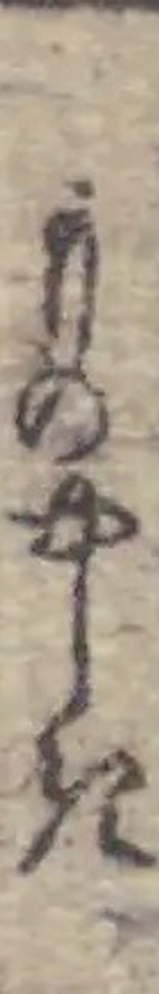ものやしき
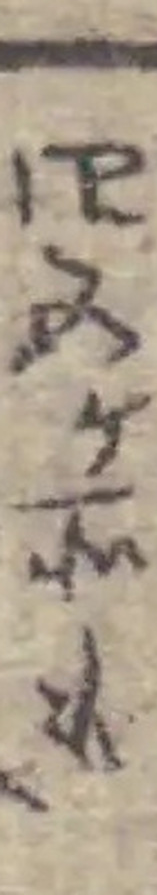四五ヶ所も
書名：作意妖恐懼感心 2巻
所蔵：国立国会図書館 National Diet Library, JAPAN
